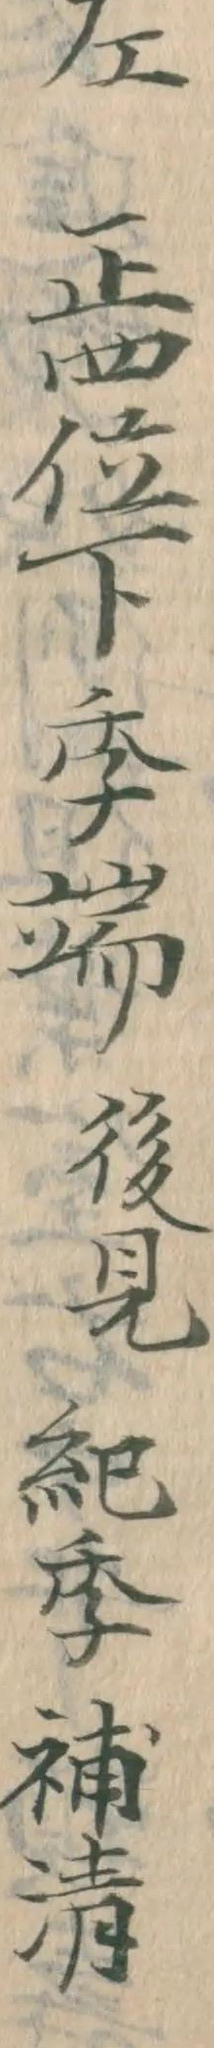左正四位下季端後見紀季補清
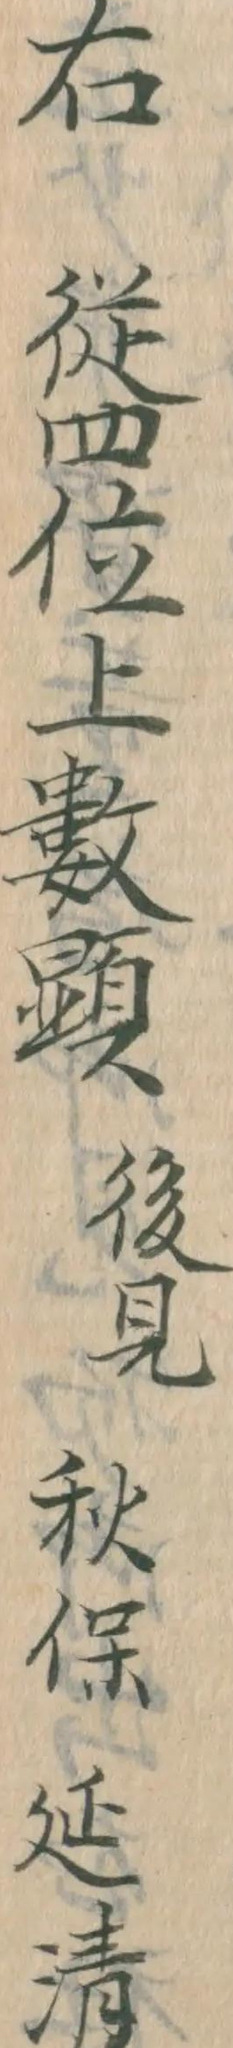右従四位上数顕後見秋保延清

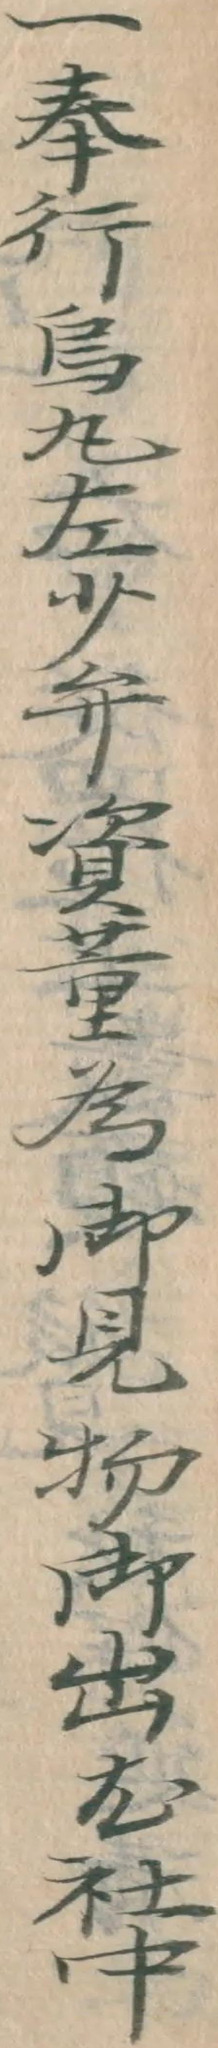一奉行烏丸左少弁資董為御見物御出尤社中
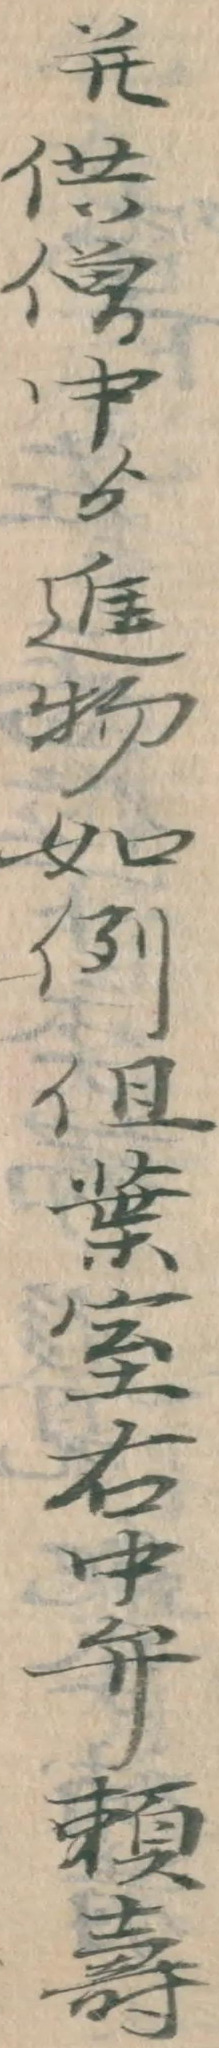并供僧中ゟ進物如例但葉室右中弁頼寿
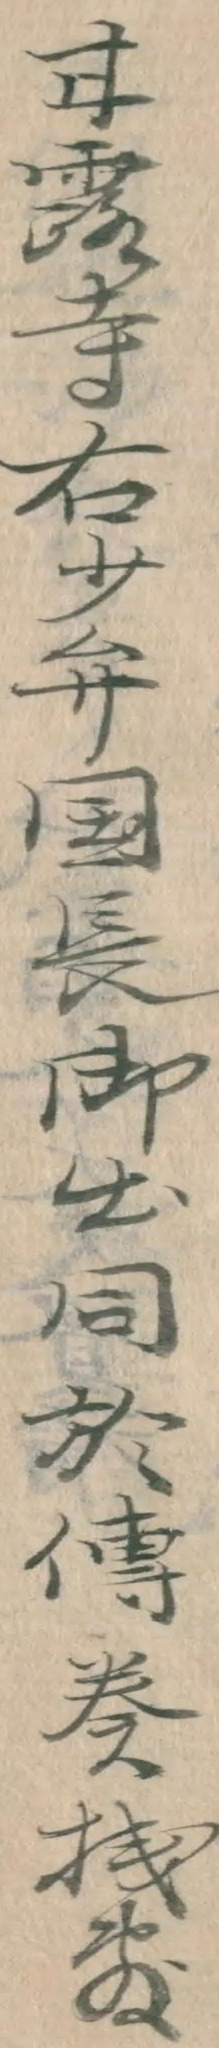甘露寺右少弁国長御出同於伝奏桟敷
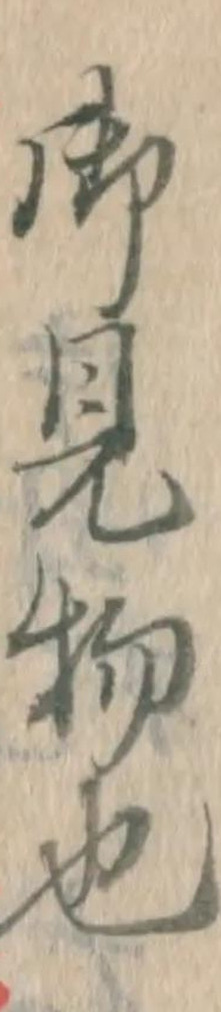御見物也
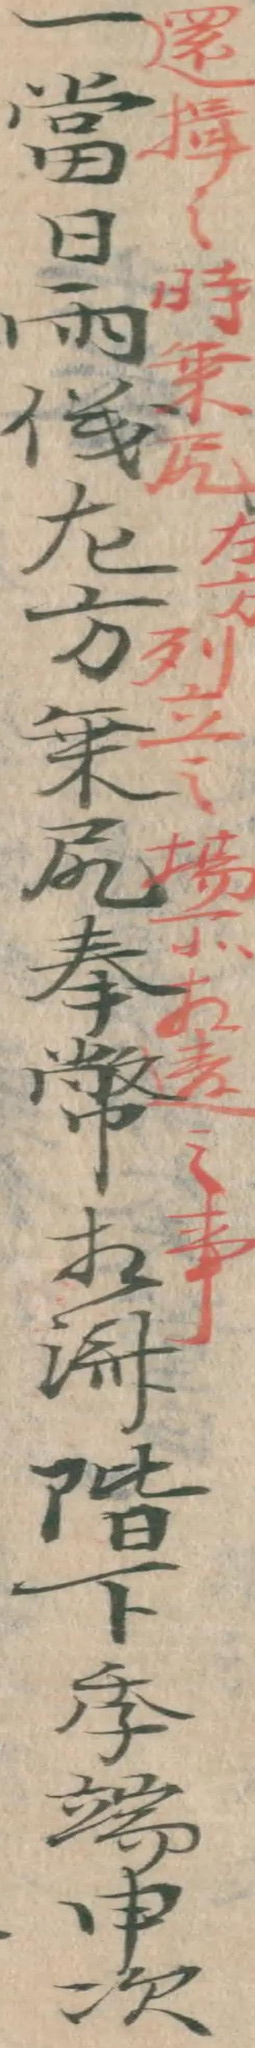一当日雨儀左方乗尻奉幣相済階下季端申次
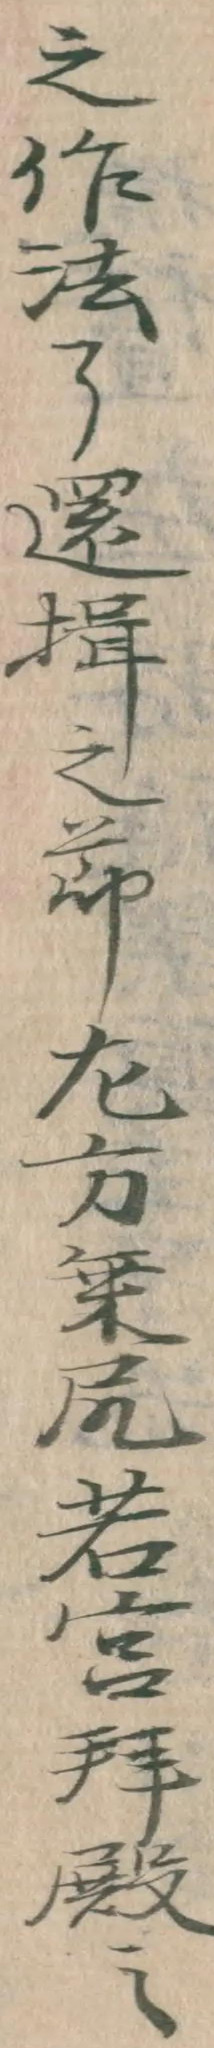之作法了還揖之節左方乗尻若宮拝殿之
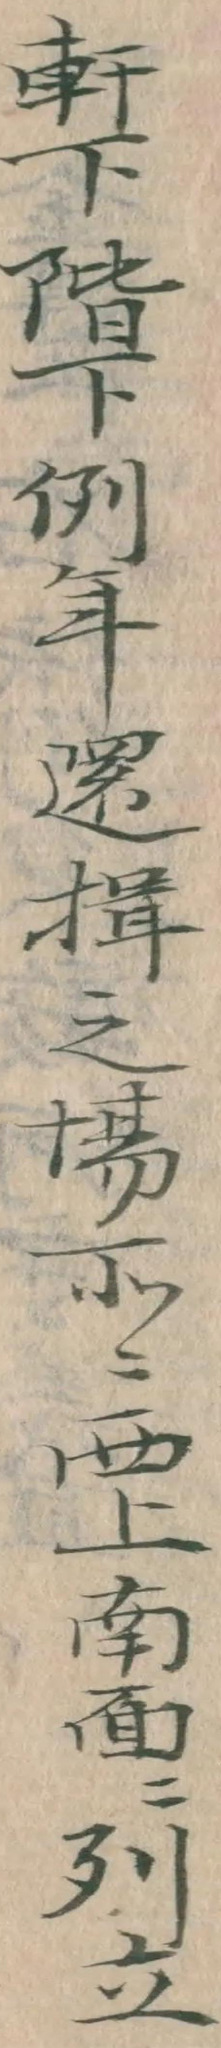軒下階下例年還揖之場所ニ西上南面ニ列立
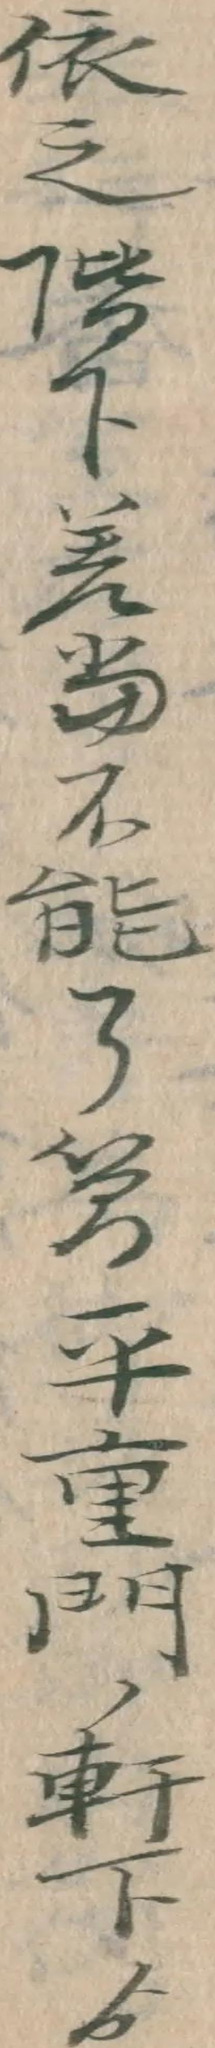依之階下差当不能了簡平重門ノ軒下ゟ
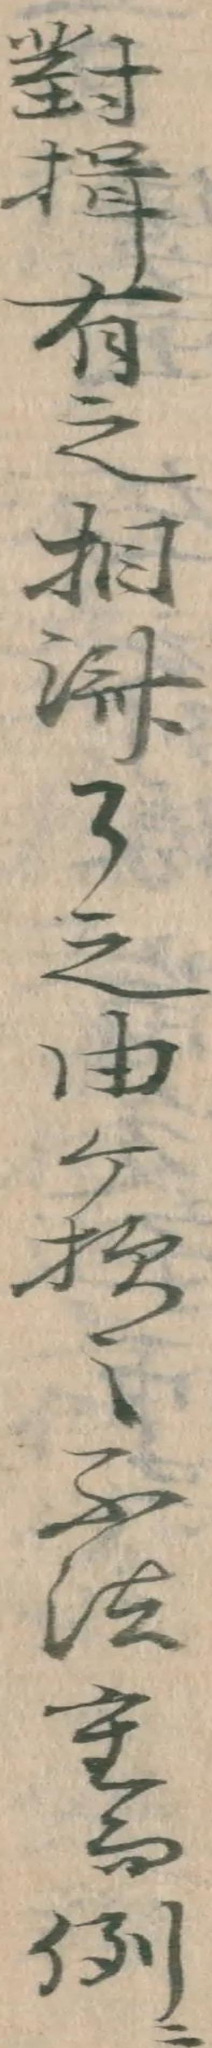対揖有之相済了之由ケ様之不法重而例ニ
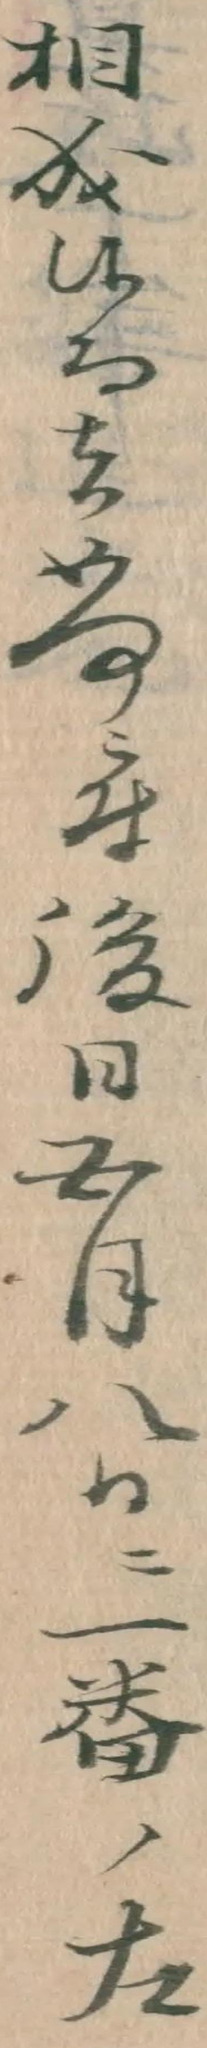相成候而者如何ニ付後日五月八日ニ一番ノ左
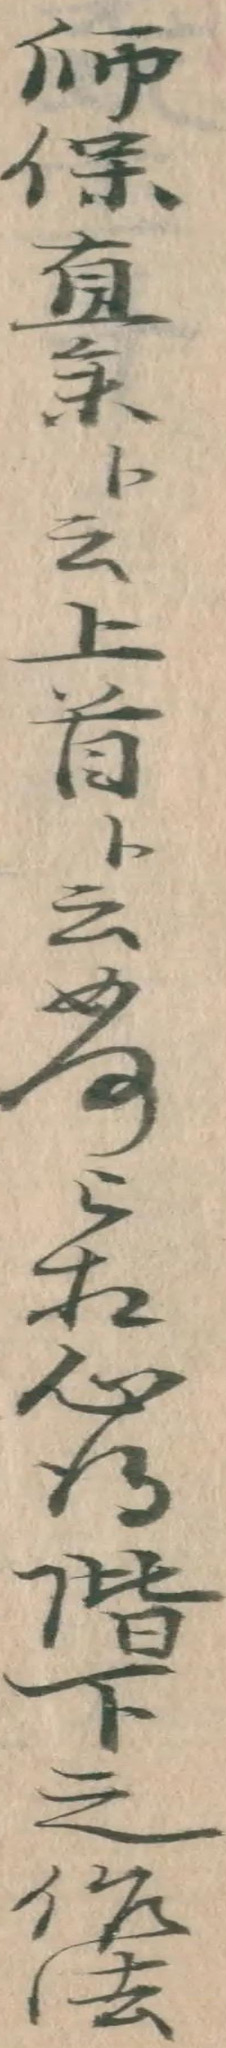師保直参ト云上首ト云如何被相心得階下之作法
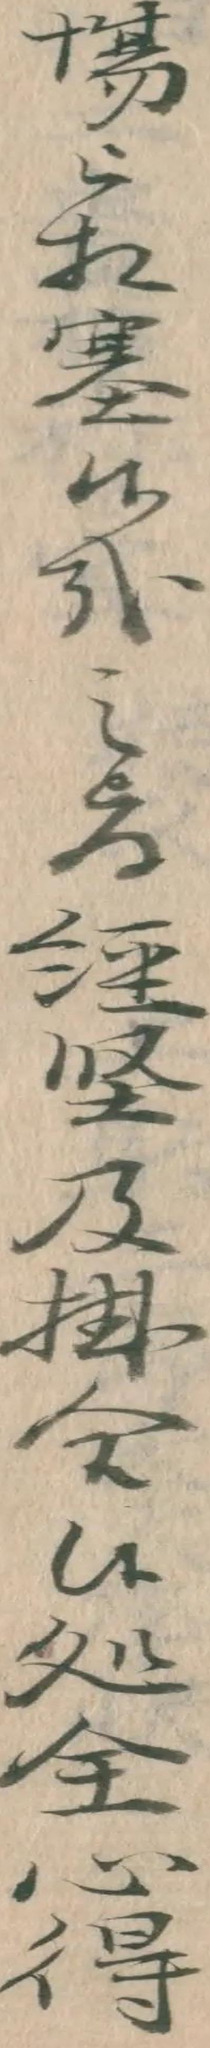場被相塞候哉之旨経堅及掛合候処全心得
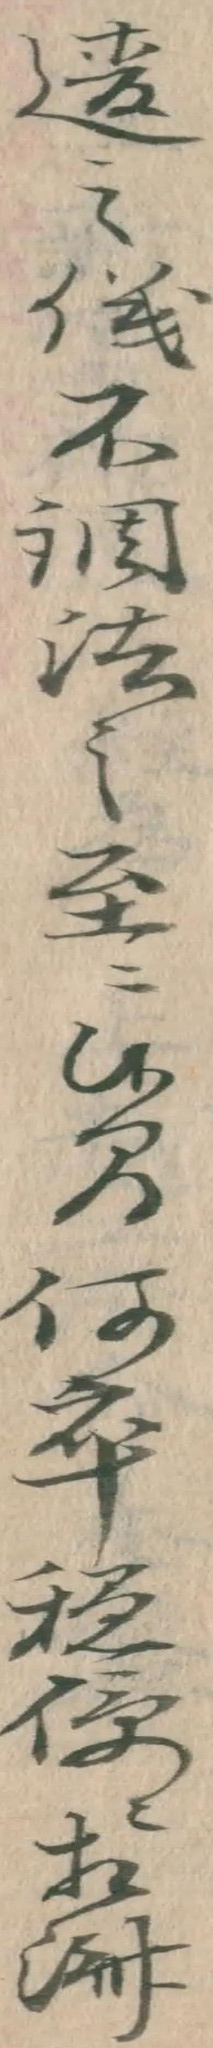違之儀不調法之至ニ候間何卒穏便ニ相済
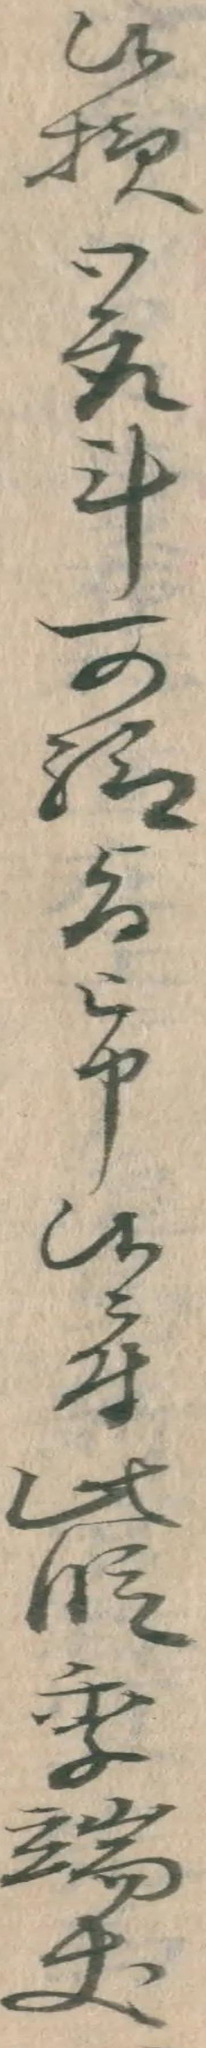候様御取計可繕旨被申候ニ付此段季端丈ヘ
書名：賀茂社記録. 第10冊
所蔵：国立国会図書館 National Diet Library, JAPAN
